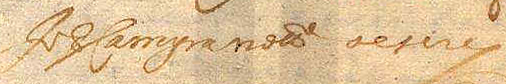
Joā Carreyra nottro o escreꝭ
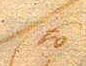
Clo
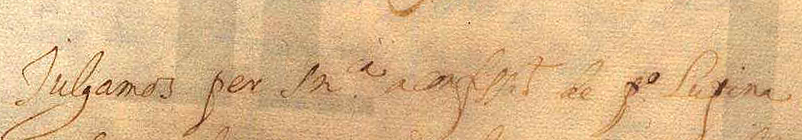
Julgamos per snça a confissaõ de po Lupina
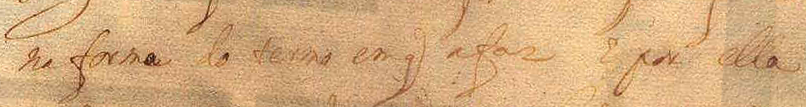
na forma do termo em q̄ a faz E por ella
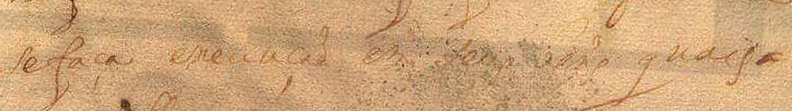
se faça execuçaõ em seus bens quais _
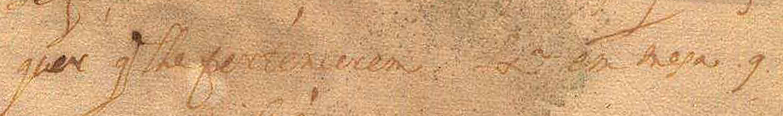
quer q̄ lhe pertencerem Lx.a em mesa .9.
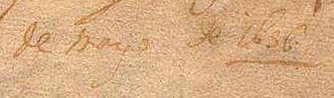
de mayo de i656.
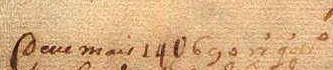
Deue mais 14$690 rs̄ q̄ o tro
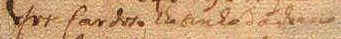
Jose Cardoso lhe tinha do
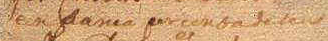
confiança por conta de seu
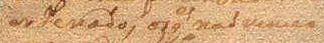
ordenado, os qes naõ uencia
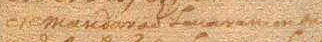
e se mandaraõ l
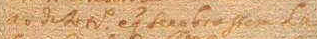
ao dito tr.o e q̄ se cobrassem da
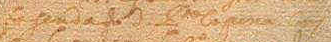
do d.o P.o lopina
